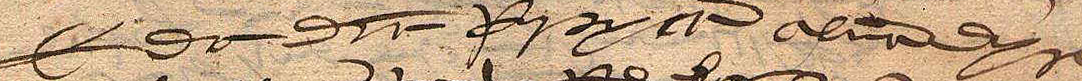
E da dt̄a pytyçā al nā dyse
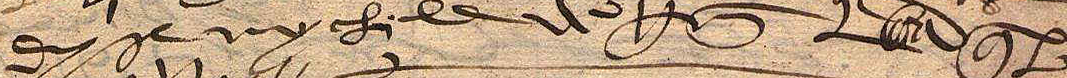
dyse nychell do gēz tbā q̄ ho
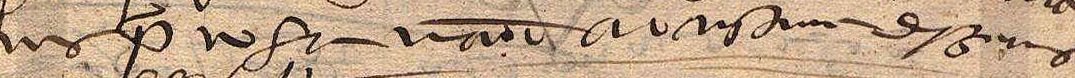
mos p̄o nosa mão ao custume djzemos
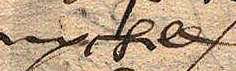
nychell /.
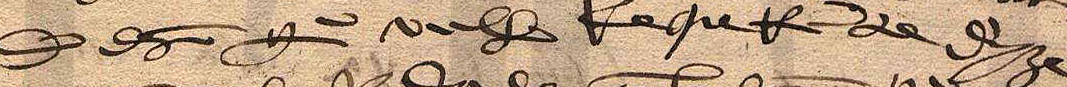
do dt̄o go coelho RequeRēte dyze
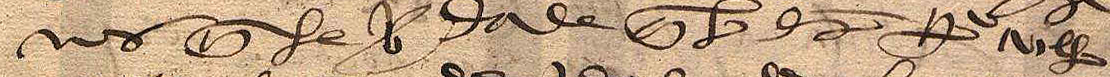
mos q̄ he ꝟdade q̄ ho dt̄o go coelho
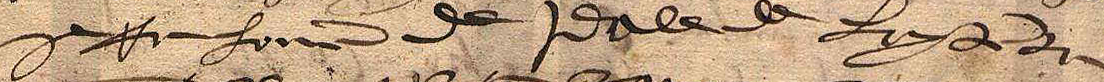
seRa homē de Jdade de hoytēta
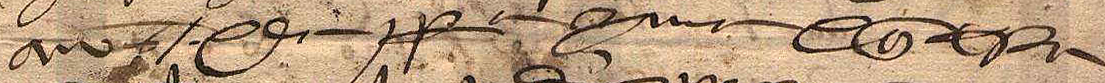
anos /. e daj ꝑa cyma e q̄ Esta
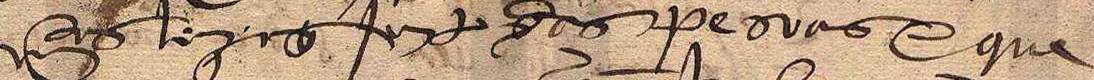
mtas vezes Junto das pesoas e que
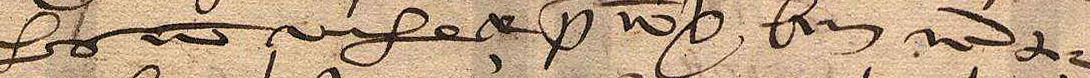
hos n̄o conheçe p̄o n̄o ꝟ bem nē ter
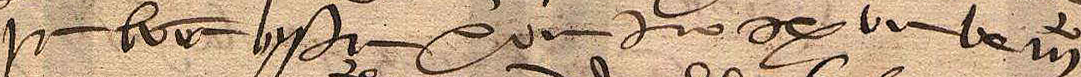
ja boōa vysta e outrosy ouve mto
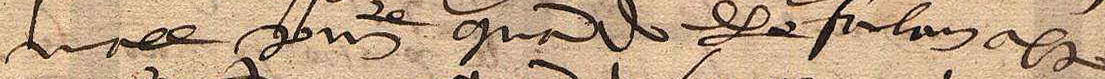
mall somte quādo lhe falam alto
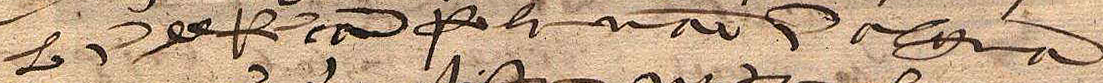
ho ēdeRēçā pola m̄ao ē alguā
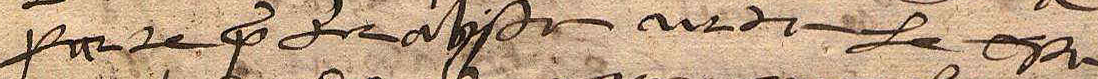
parte p̄o ter a vysta curta he Esta
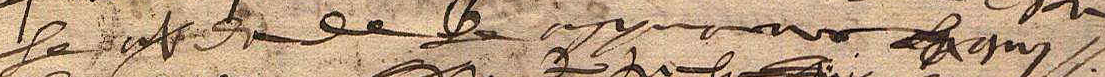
he a ꝟdade he asynamos haquj //
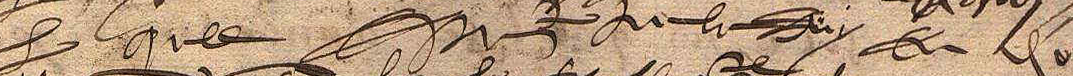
ho qall Estrmto treladey Eu do
